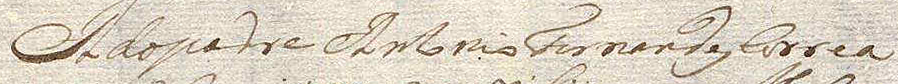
Rdo padre Antonio Fernandes Correa
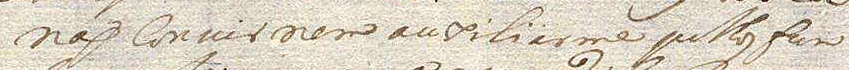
naõ conuir nem auxiliarme pellos fun
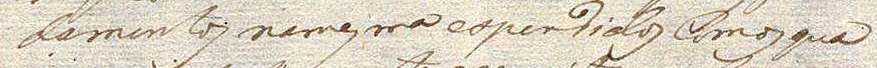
damentos na mesma espendidos com os qua
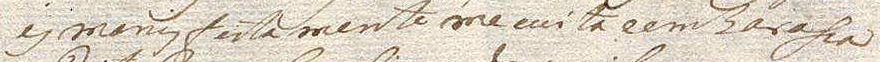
is manisfestamente me custa e embarassa
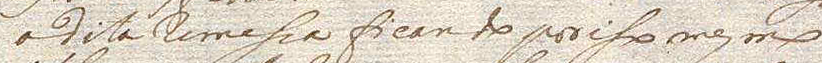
a dita Remessa ficando por isso mesmo
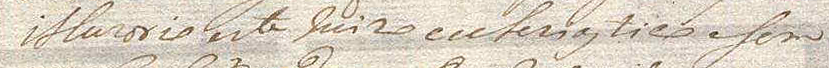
illuzorio este Iuizo eccleziastico e sem
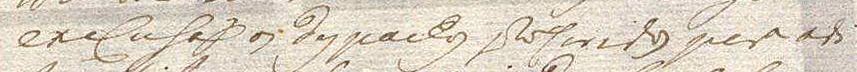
exeCusaõ os despachos proferidos pera o di
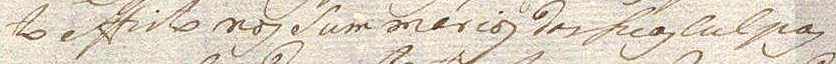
to effeito nos summarios das suas culpas
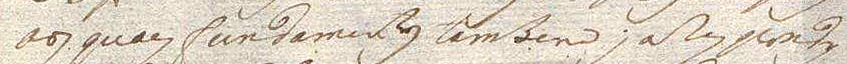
aos quaes fundamentos tambem ja Respondy
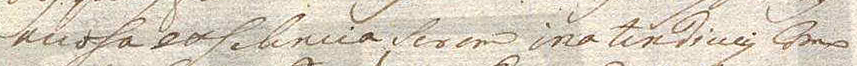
a uosa exselencia serem inatendiueis Como
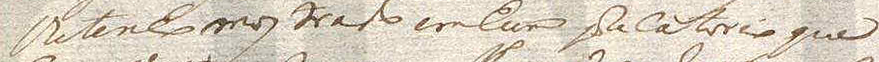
lhe tenho mostrado em hum pRecatorio que
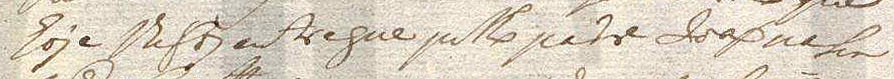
hoje lhe foj entregue pello padre Ioaõ ualem
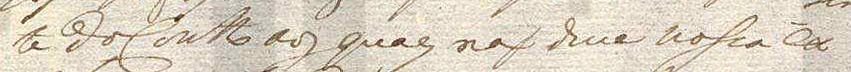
te do Coulto aos quaes naõ deue uossa ex
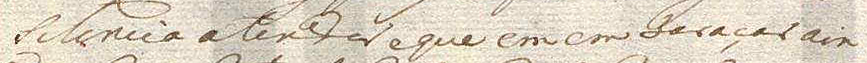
selencia atender, e que em embaraçar ain
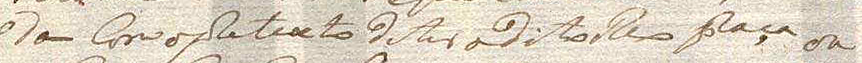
da Com o pRetexto de ter o dito Reo pRaça ou
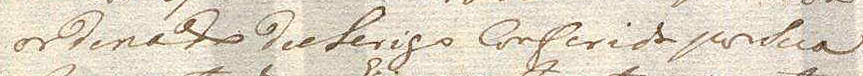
ordenado de clerigo Conferido por Sua
